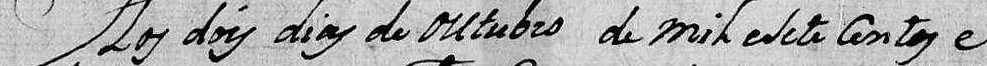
Aos dois dias de outubro de mil e seteCentos e
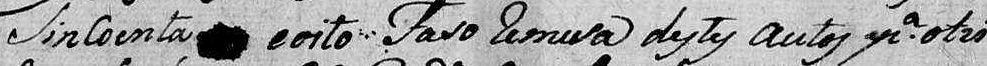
sinCoenta e oito Faso Remesa destes autos p.a o tri
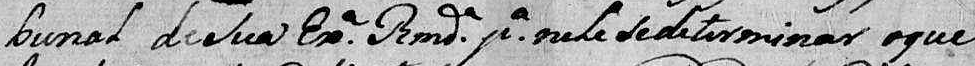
bunal de sua Ex.a Rmd.a p.a nele se determinar o que
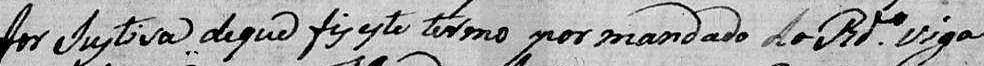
for Iustisa de que fis este termo por mandado do Rd.o viga
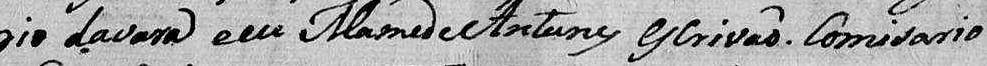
rio da vara e eu Mamede Antunes esCrivaõ. Comisario
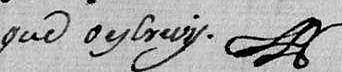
que o esCrevy.
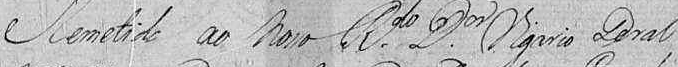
Remetido ao Nosso R.do D.or Vigario Geral
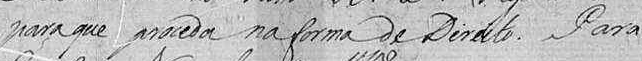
para que proceda na forma de Direito. Pará
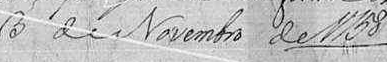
3 de Novembro de 1758
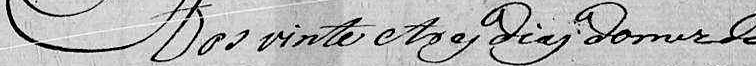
Aos vinte e tres dias do mez de
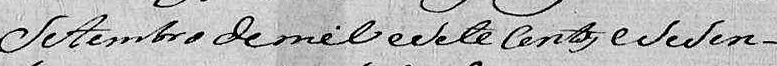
setembro de mil e seteCentos e sesen
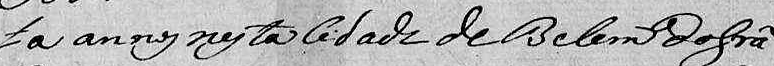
ta annos nesta Cidade de Belem do Grã
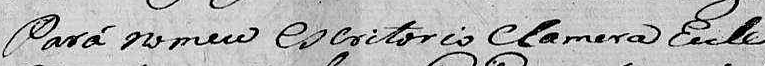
Pará no meu escritorio e Camera Eccle
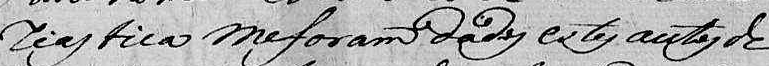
Ziastica me foram dados estes autos de
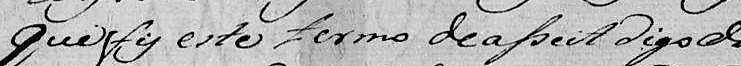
que fis este termo de asseit digo de
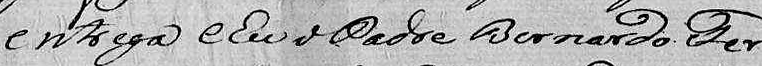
entrega e Eu o Padre Bernardo Fer
